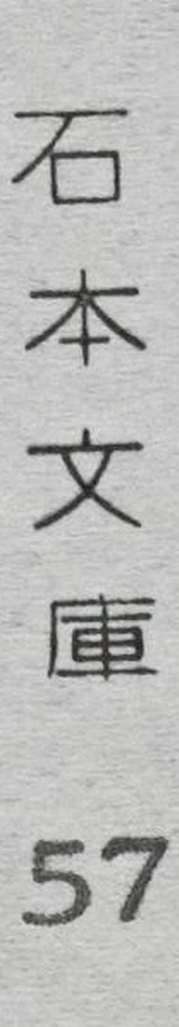石本文庫
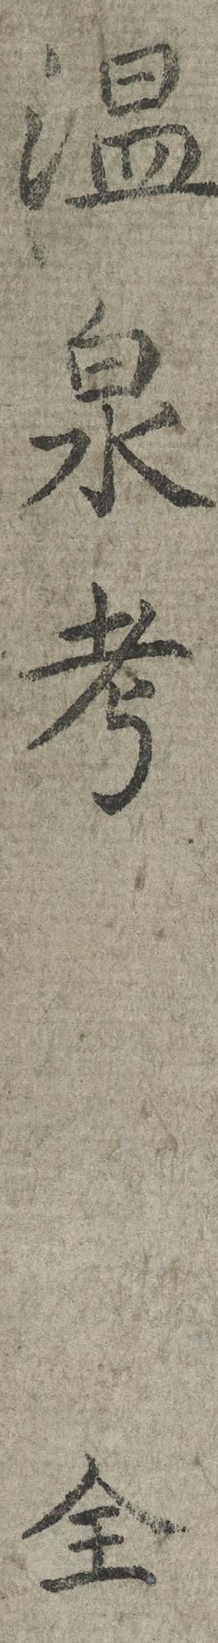温泉考全

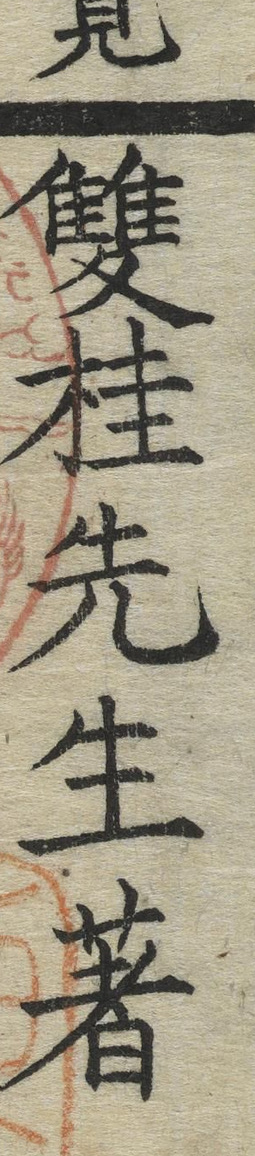雙桂先生著
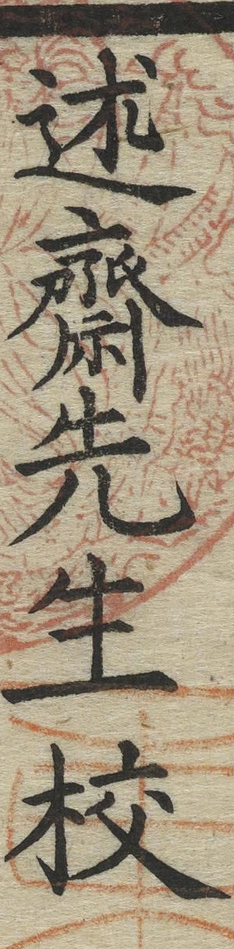述齋先生校
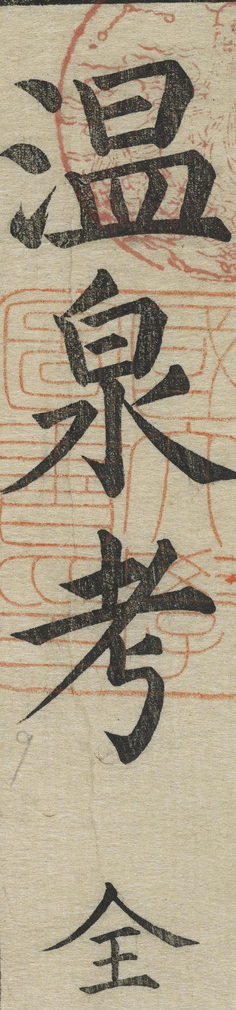温泉考全
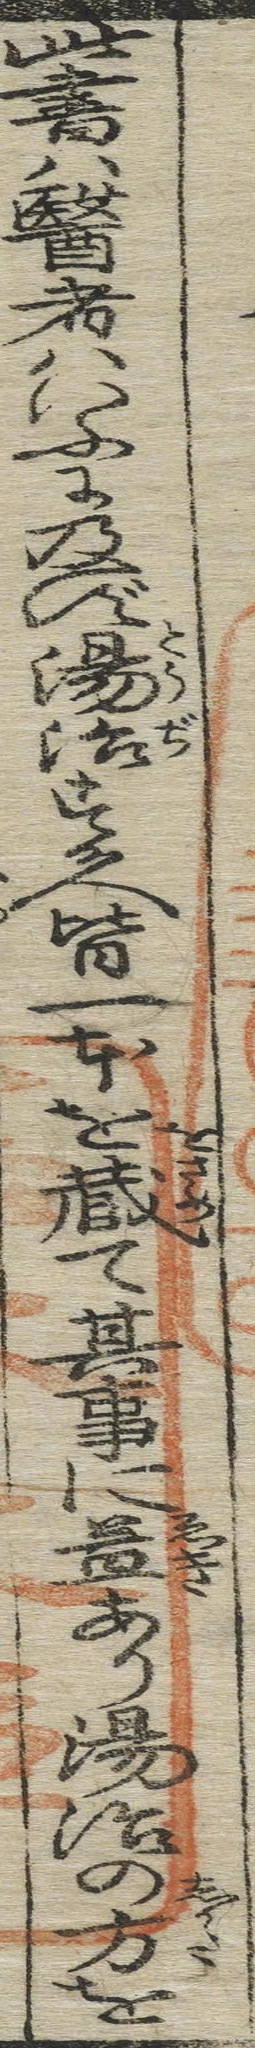此書ハ醫者ハいふに及ず湯治する人皆一本を蔵て其事に益あり湯治の方を
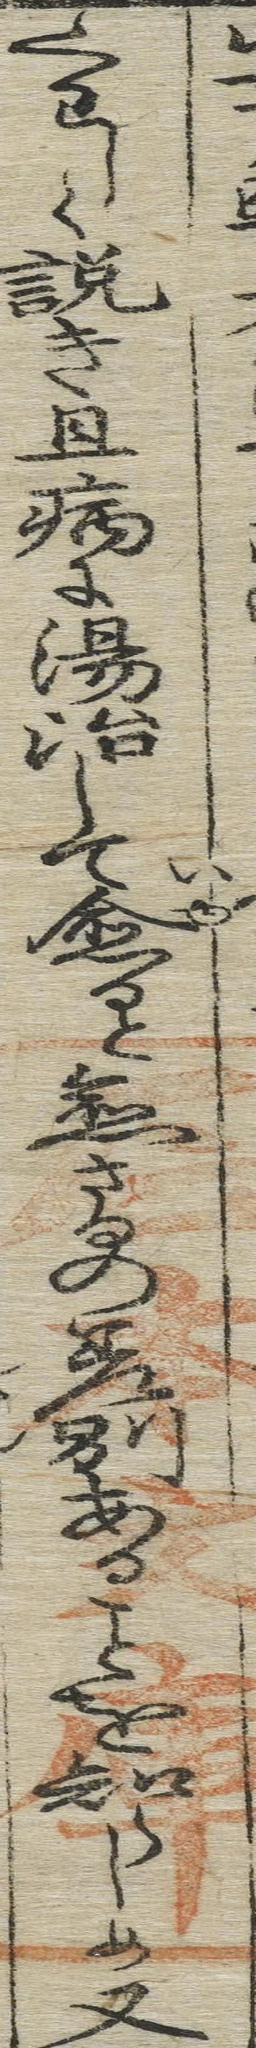くわしく説き且病に湯治して癒ると癒さるの差別あることを知らしめ又
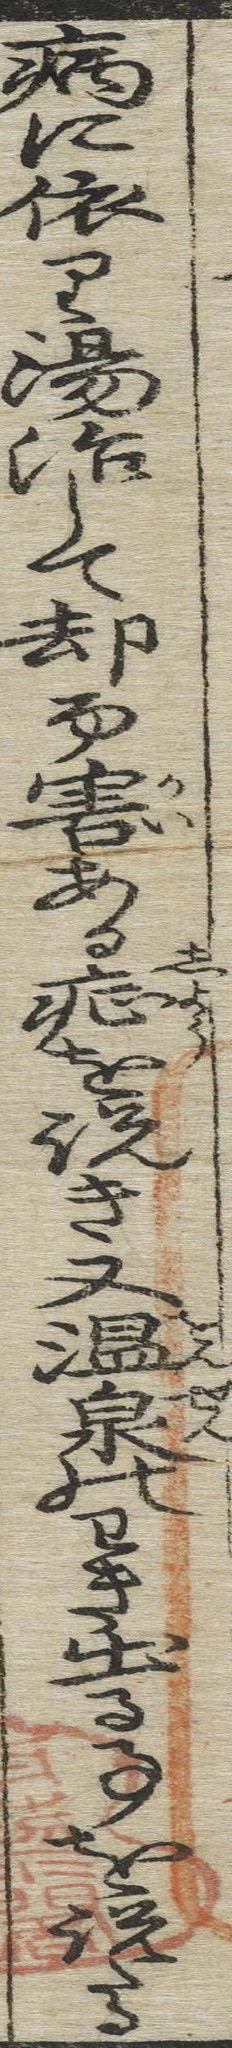病に依り湯治して却而害ある症を説き又温泉のわき出る事を説たる
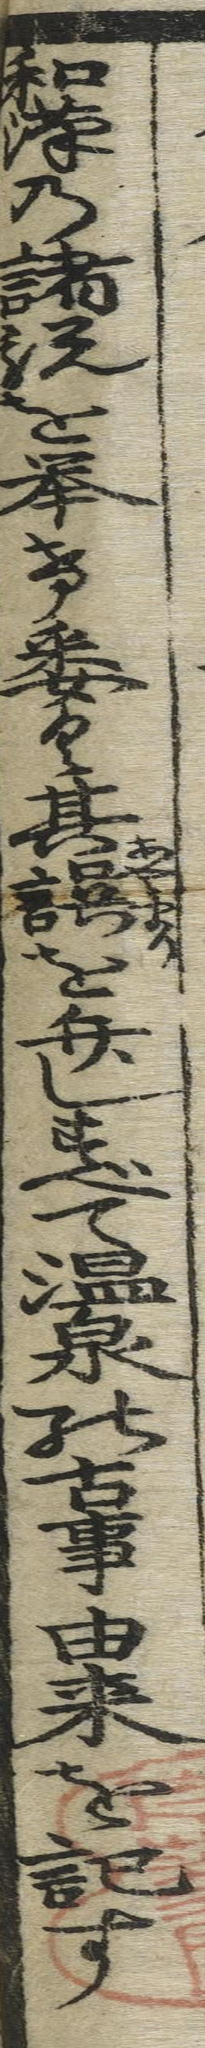和漢の諸説を挙け委く其誤を弁しすべて温泉の古事由来を記す
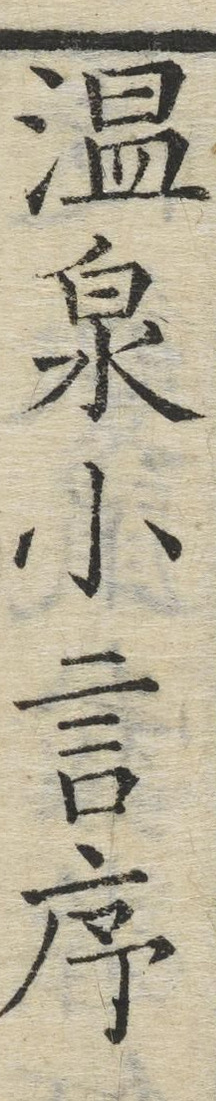温泉小言序
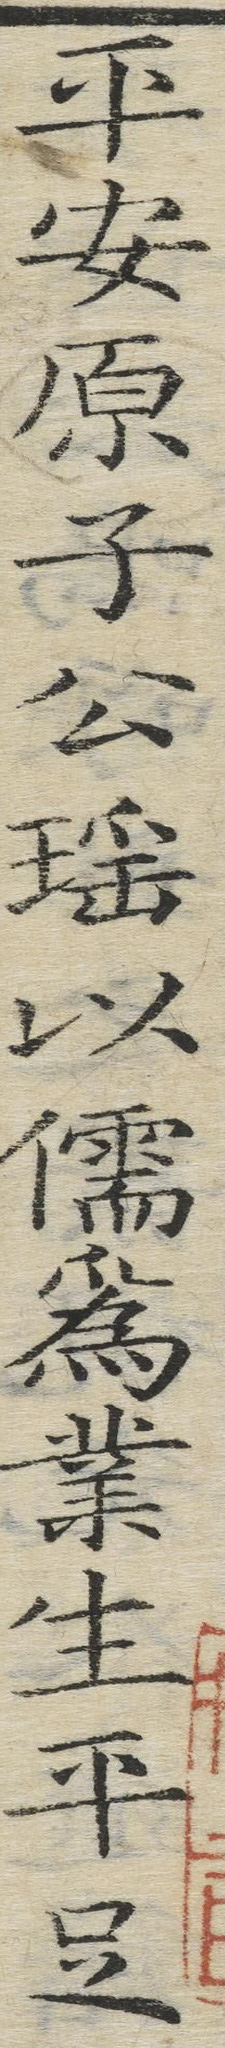平安原子公瑶以儒爲業生平足
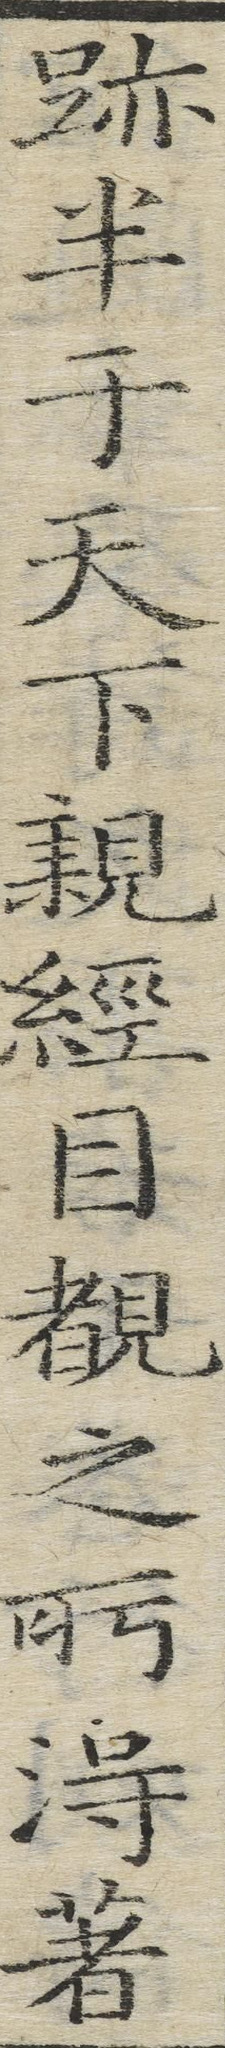跡半于天下親経目覩之所得著
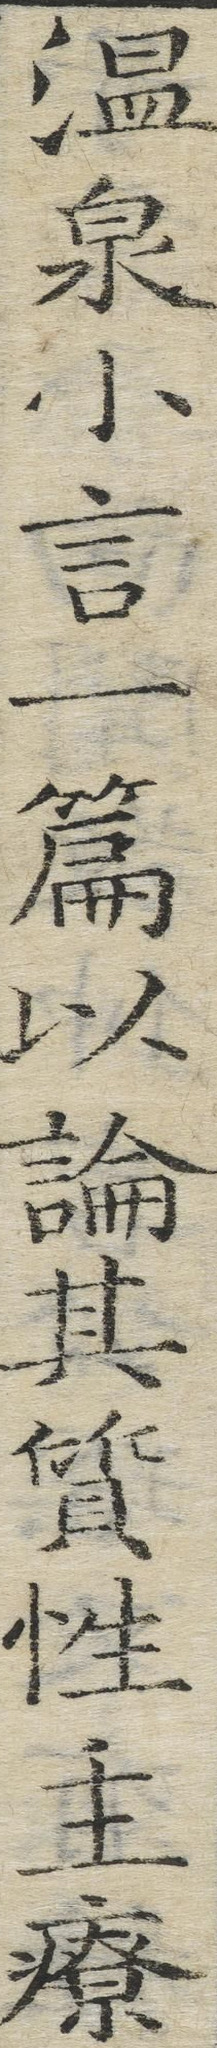温泉小言一篇以論其質性主療
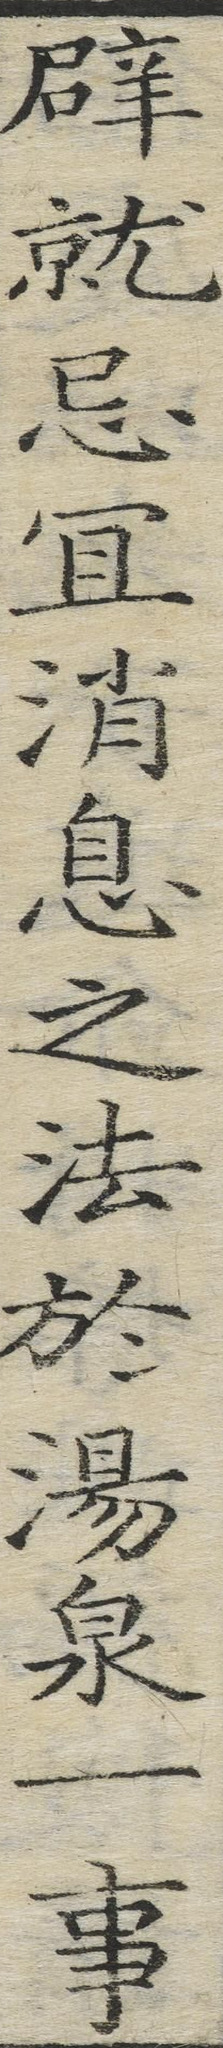辟就忌宜消息之法於湯泉一事
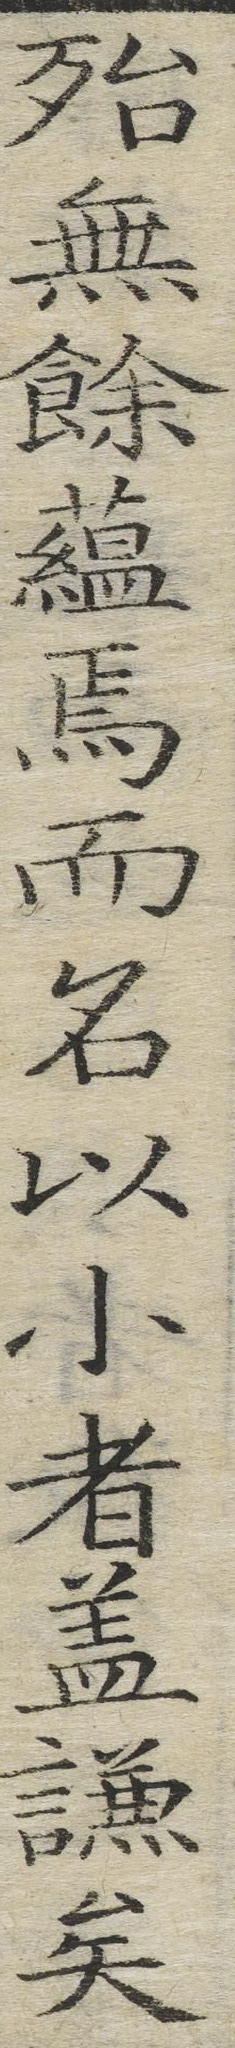殆無餘蘊焉而名以小者蓋謙矣
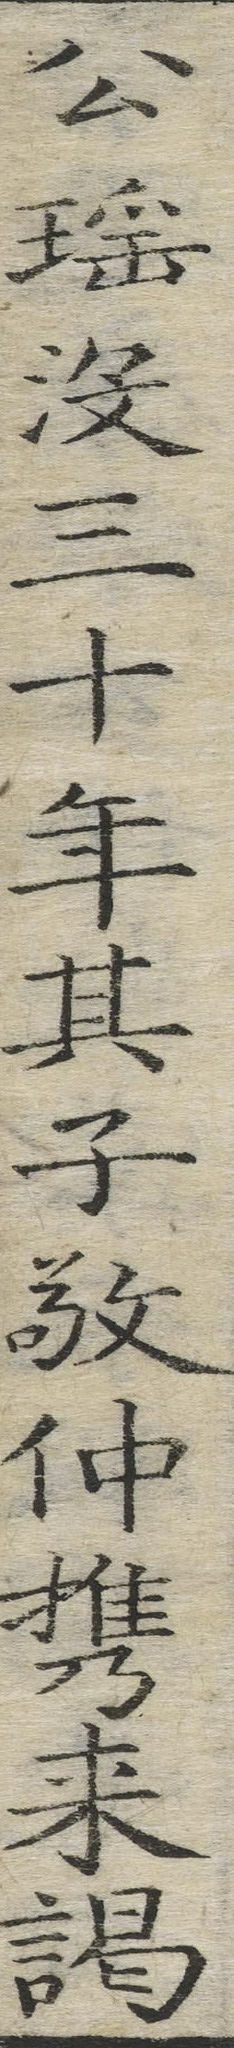公瑶没三十年其子敬仲携来謁
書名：温泉考
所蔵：東京大学地震研究所図書室 Earthquake Research Institute Library, The University of Tokyo, JAPAN
